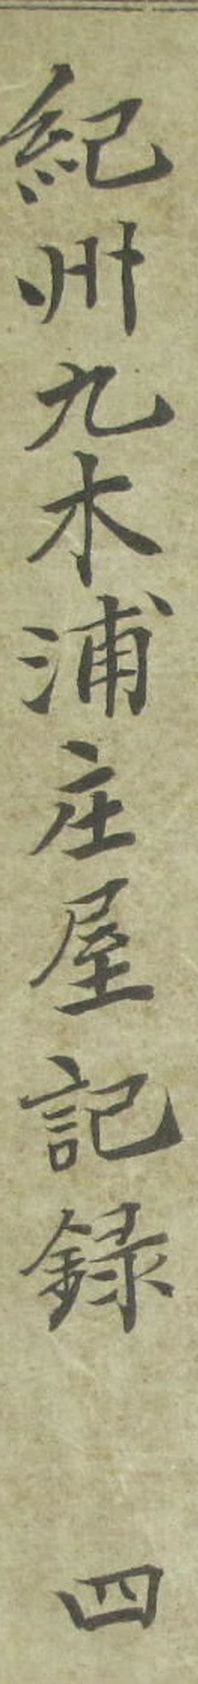紀州九木浦庄屋記録四

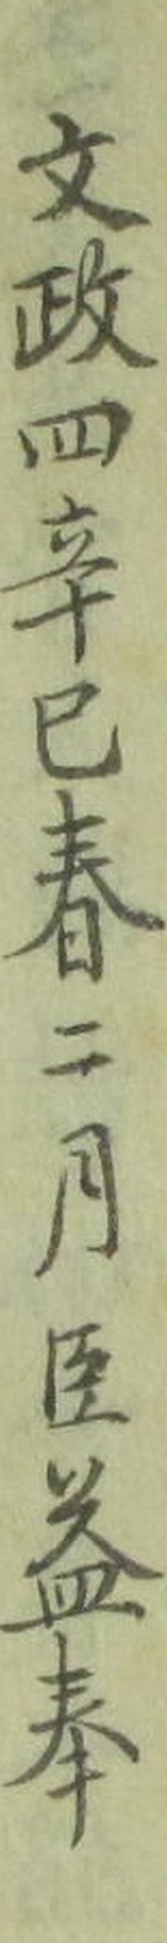文政四辛巳春二月明臣益奉
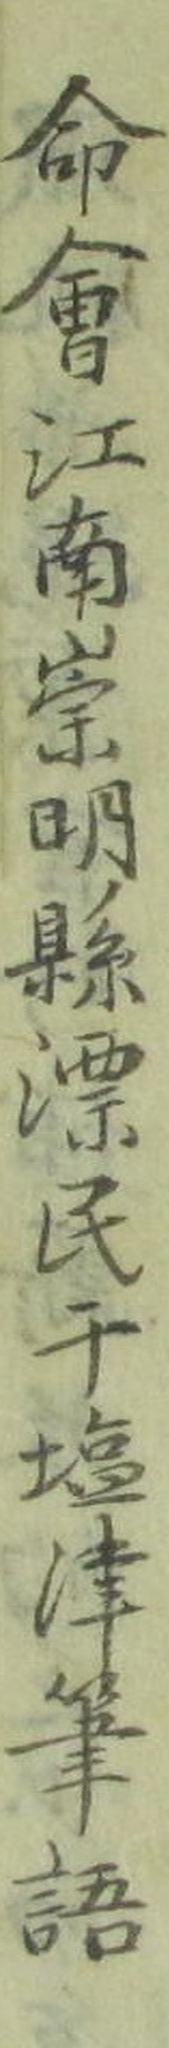命会江南崇県漂民于塩津筆語
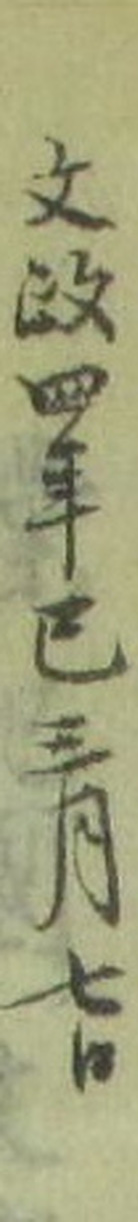文政四年巳三月七日
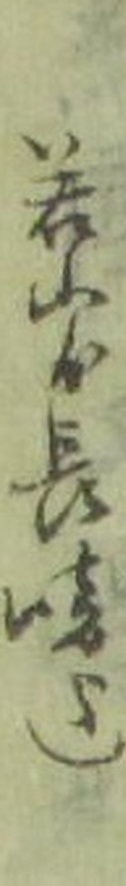若山ゟ長崎迄
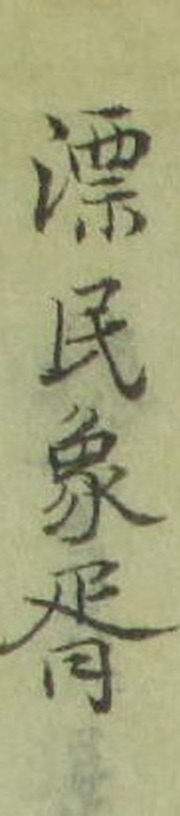漂民象胥
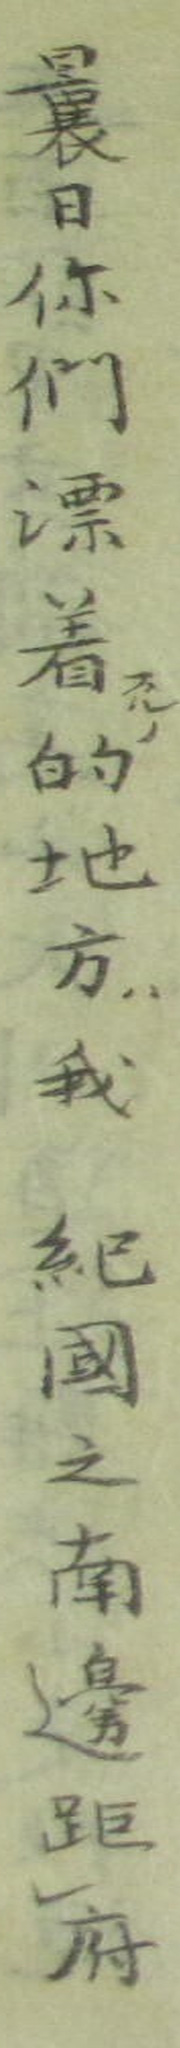曩日你們漂着的地方我紀国之南辺距府

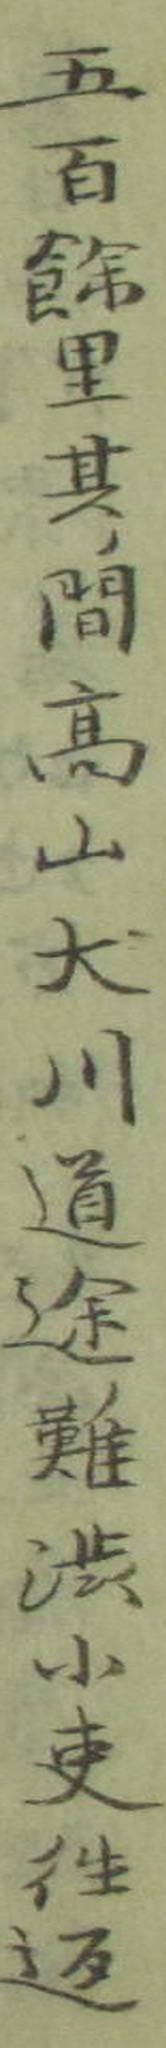五百餘里其間高山大川道途難渋小吏往返
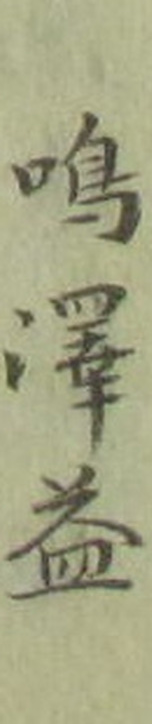鳴沢益
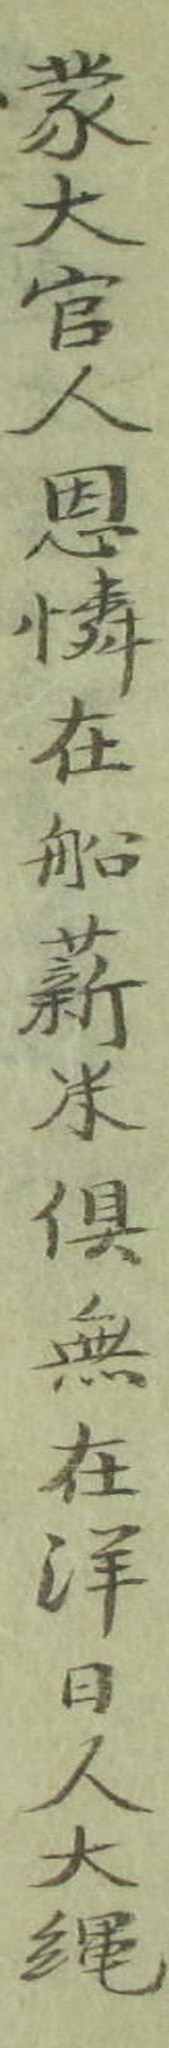蒙大官人恩憐在船薪米俱無在洋日人大繩
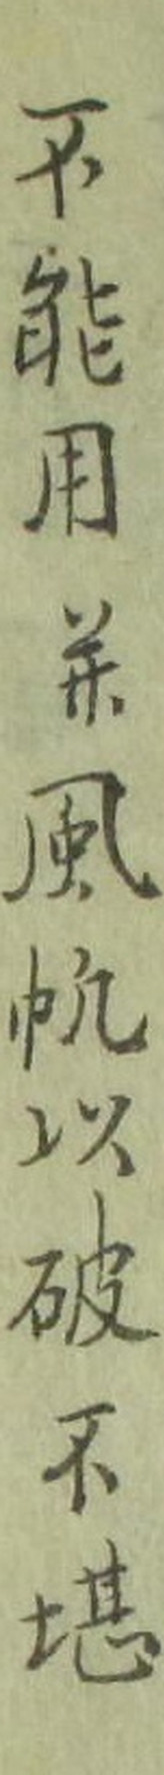不能用幷風帆以破不堪王
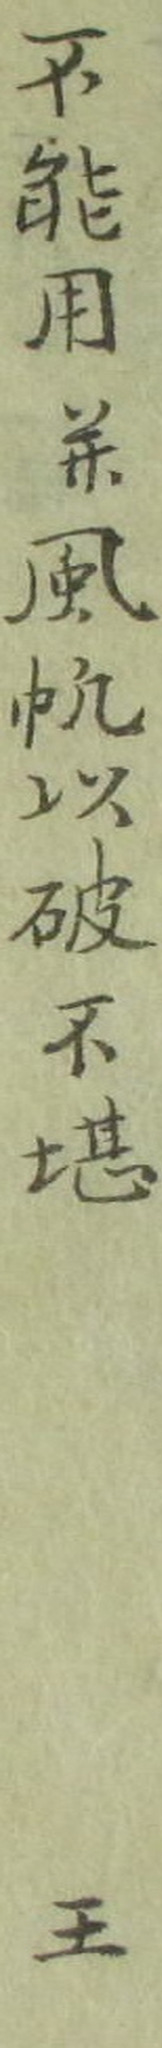不能用幷風帆以破不堪王
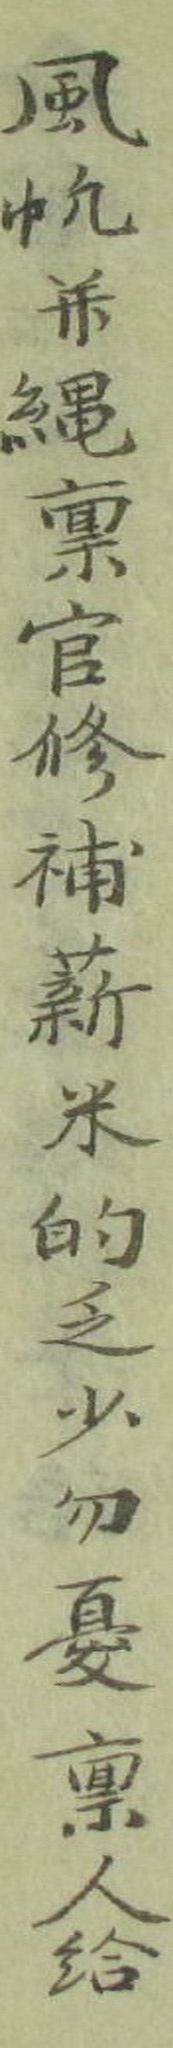風帆幷縄稟官修補薪米的乏少勿憂稟人給
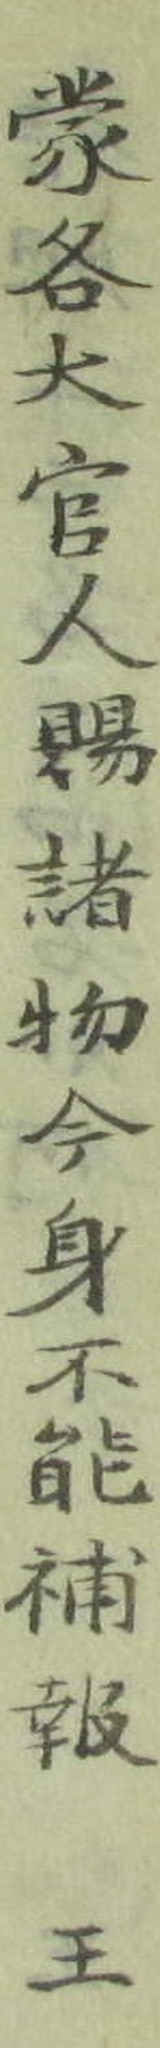蒙各大官人賜諸物今身不能補報王
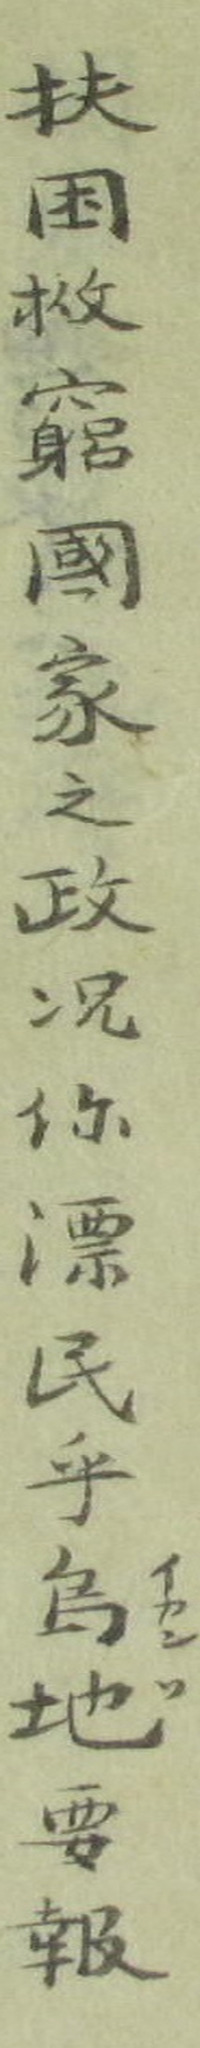扶困救窮国家之政況你漂民乎島地要報

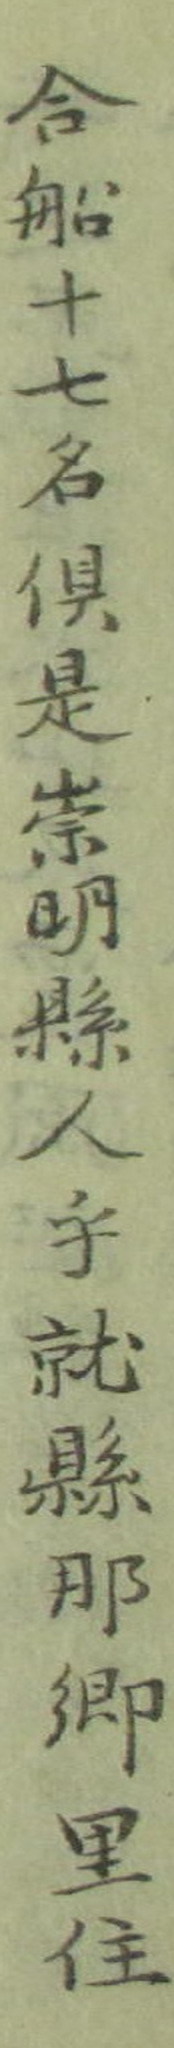合船十七名倶是崇明県人乎就県那郷里住
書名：紀州九木浦庄屋記録 四
